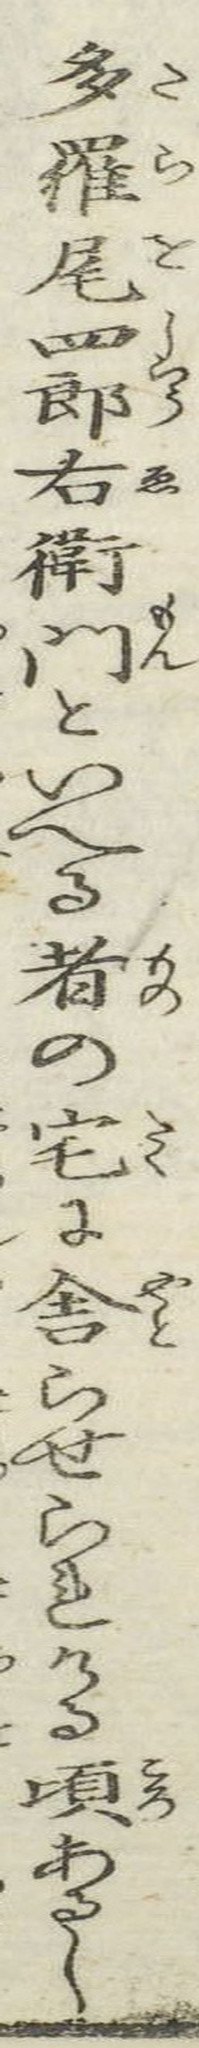多羅尾四郎右衛門といへる者の宅に舎らせられける頃あるし
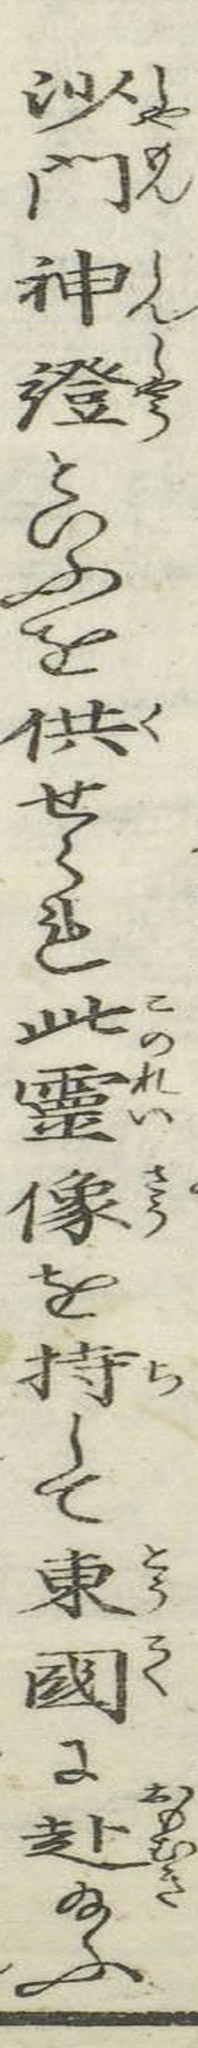沙門神證といふを供せられ此霊像を持して東國に赴給ふ
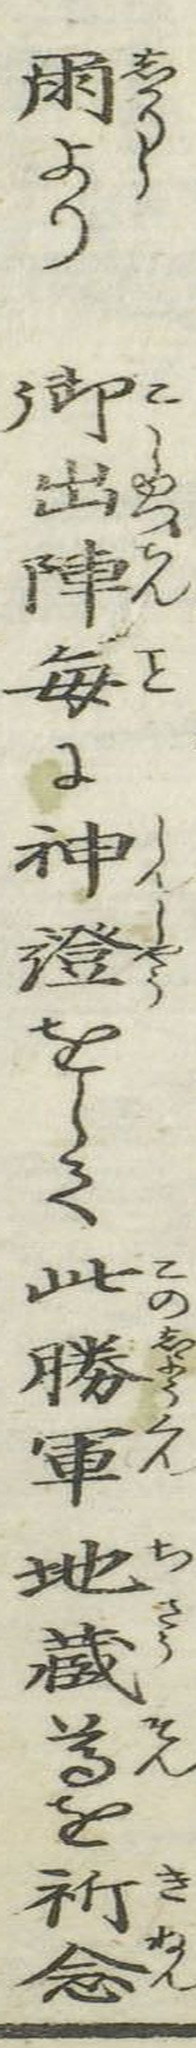爾より御出陣毎に神證をして此勝軍地蔵尊を祈念
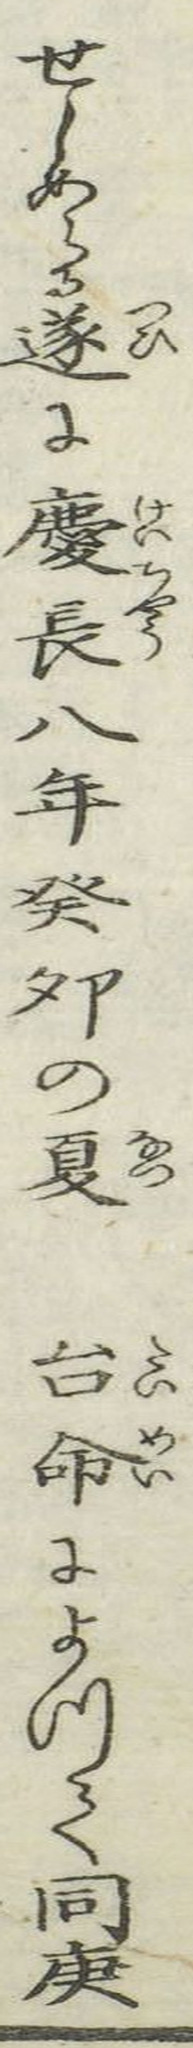せしめたる遂に慶長八年癸卯の夏台命によつて同庚
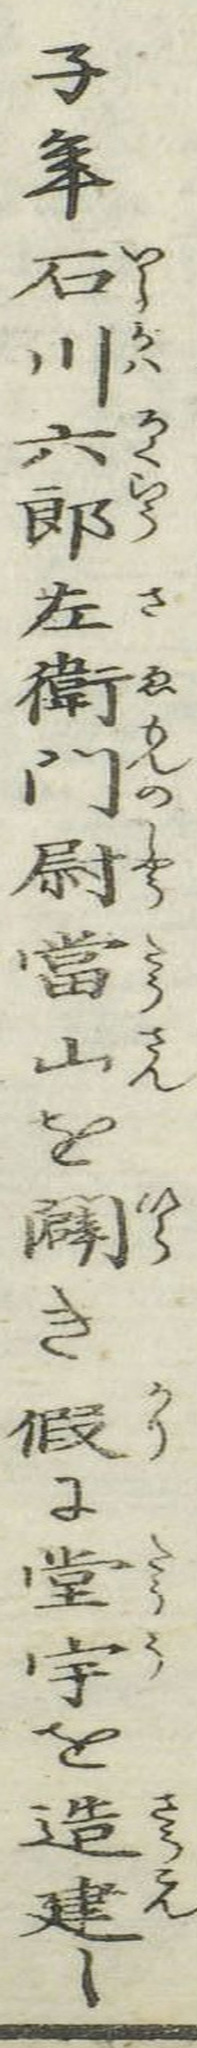子年石川六郎左衛門尉當山を闢き假に堂宇を造建し
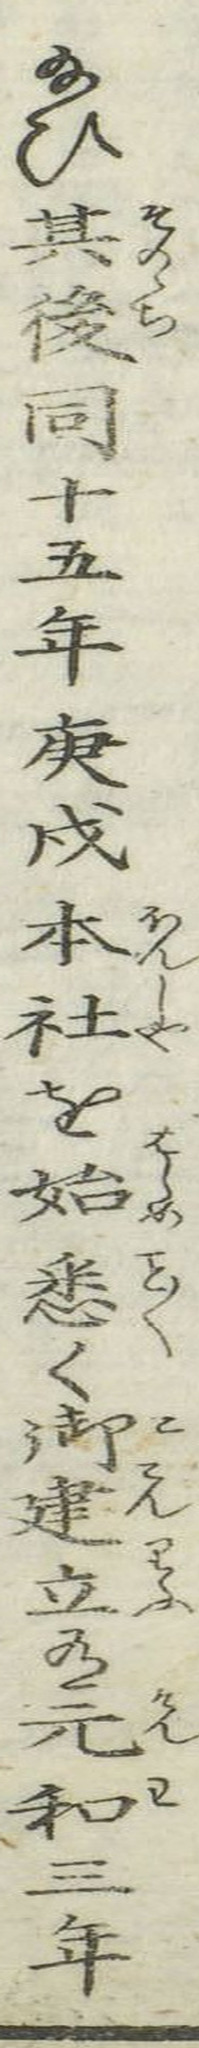給ひ其後同十五年庚戌本社を始悉く御建立有元和三年
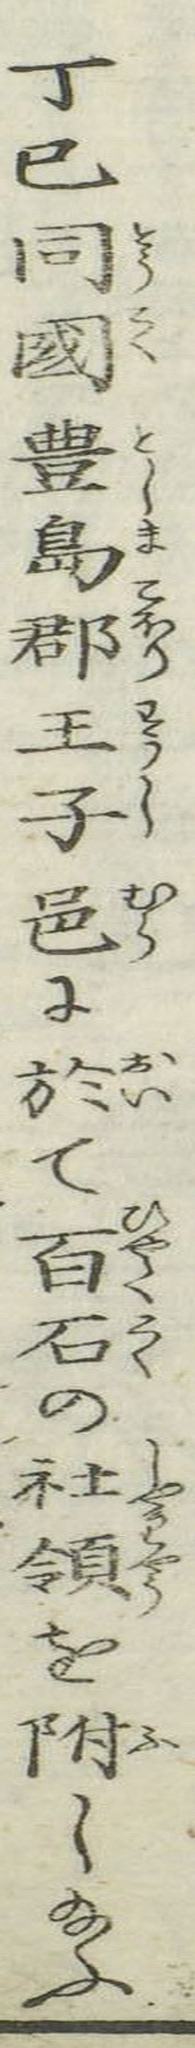丁巳同國豊島郡王子邑に於て百石の社領を附し給ふ

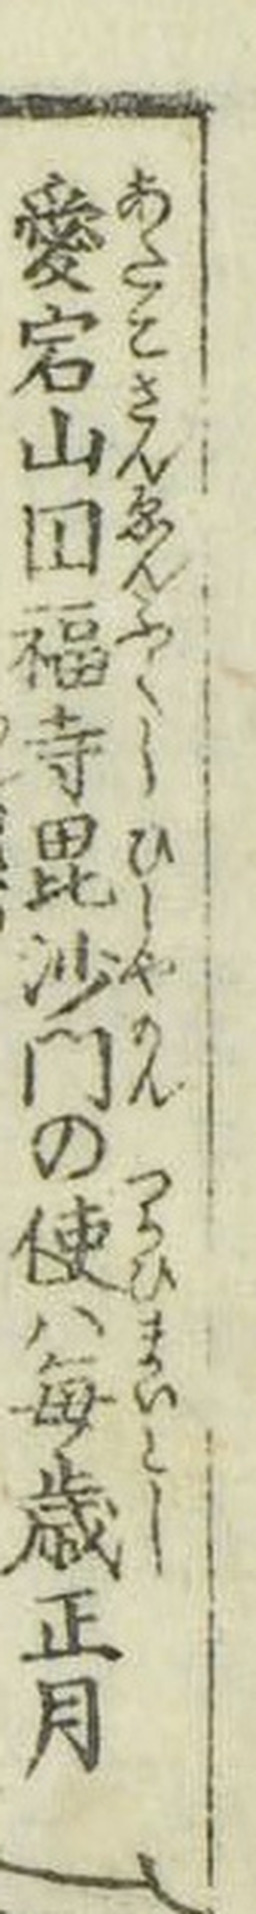愛宕山円福寺毘沙門の使は毎歳正月
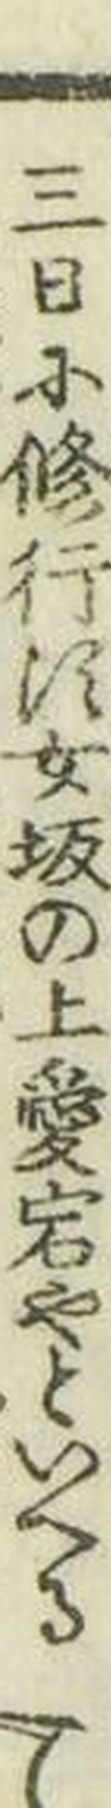三日に修行す女坂の上愛宕やといへる
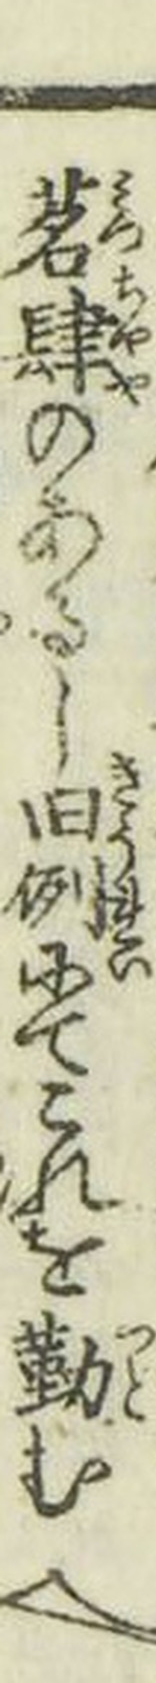茗肆のあるし旧例にてこれを勤む
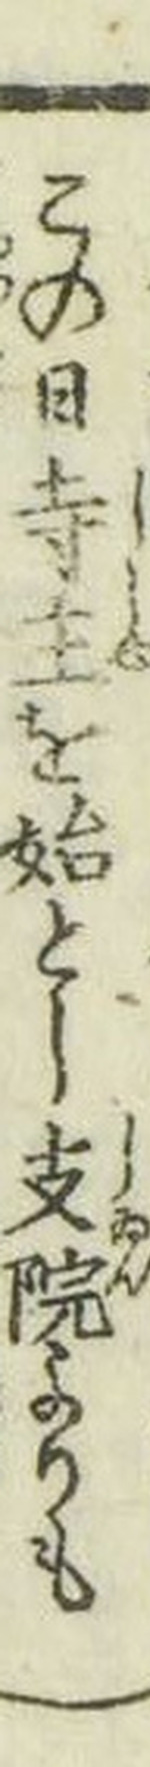この日寺主を始とし支院よりも
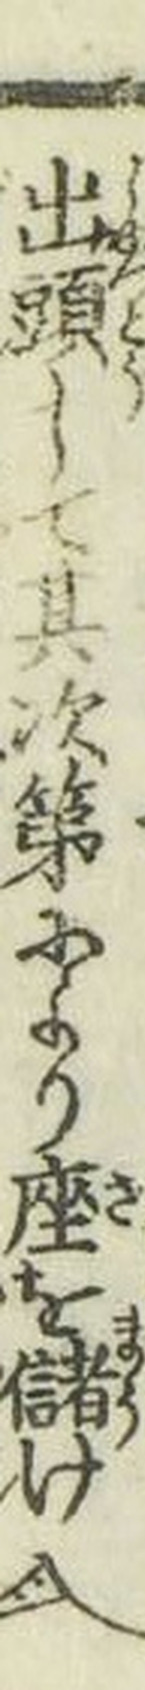出頭して其次第により座を儲け
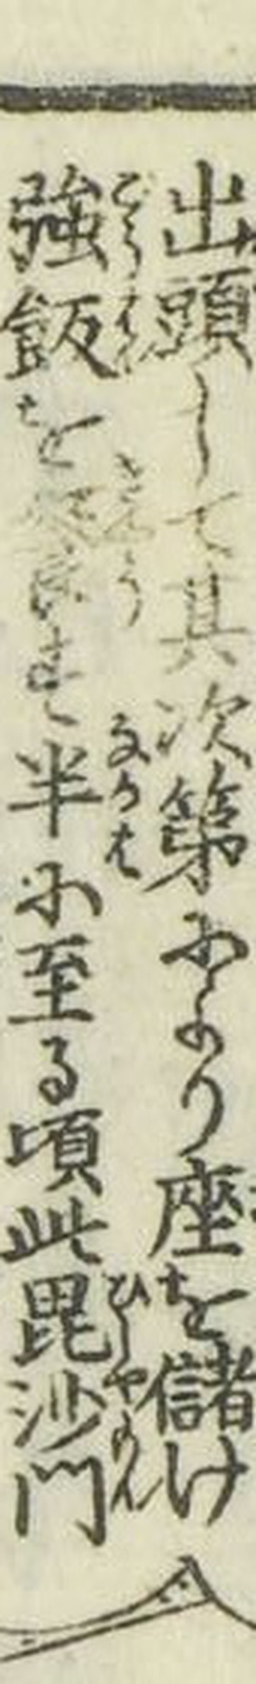強飯を饗す半に至る頃此毘沙門
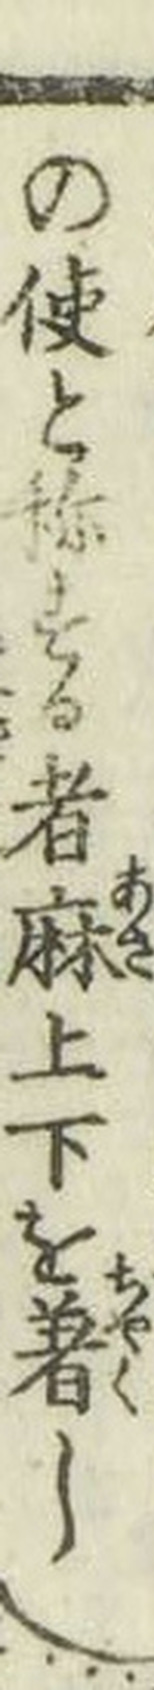の使と称する者麻上下を着し
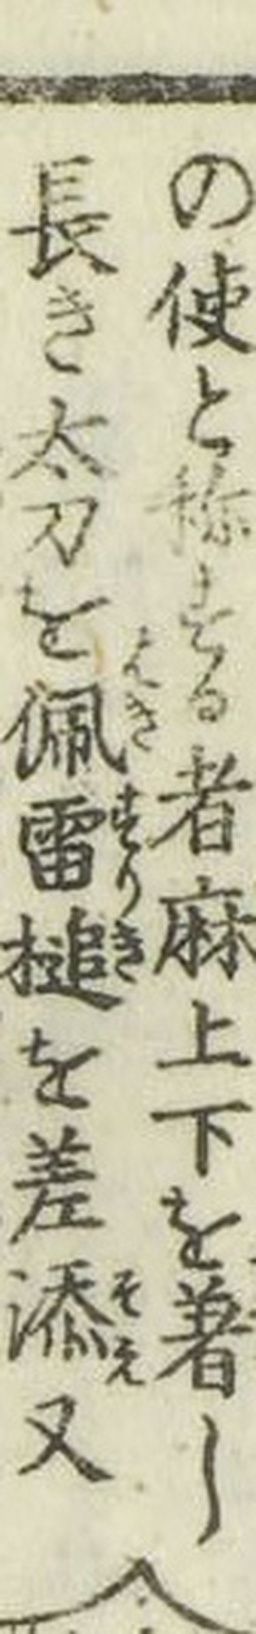長き太刀を佩雷槌を差添又
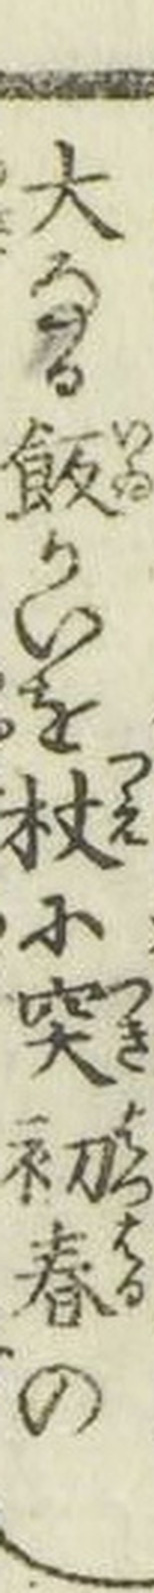大なる飯かいを杖に突初春の
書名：江戸名所図会 20巻 巻之3
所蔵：東京学芸大学教育コンテンツアーカイブ
